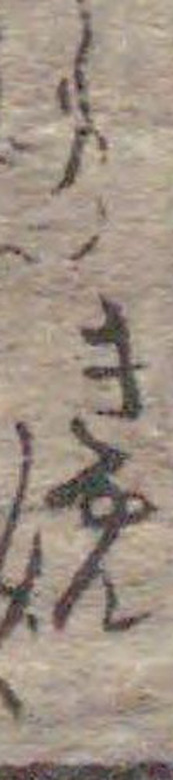きやん
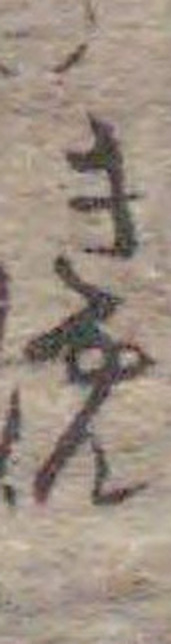きやん
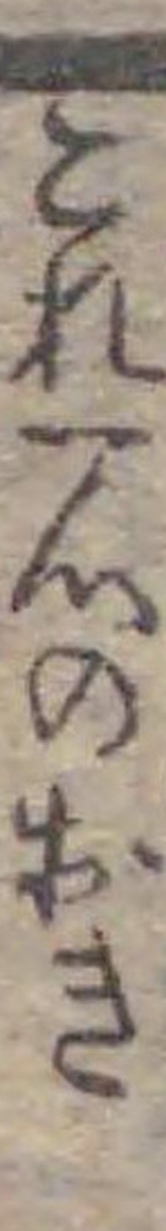これ一心のおき
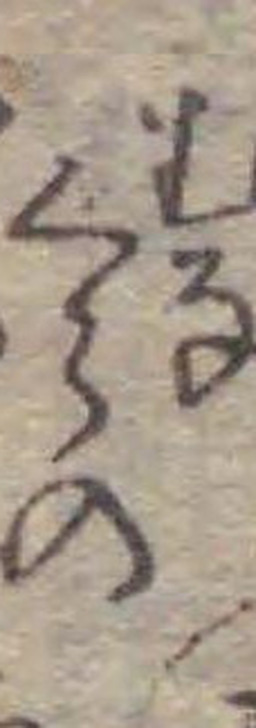くらの
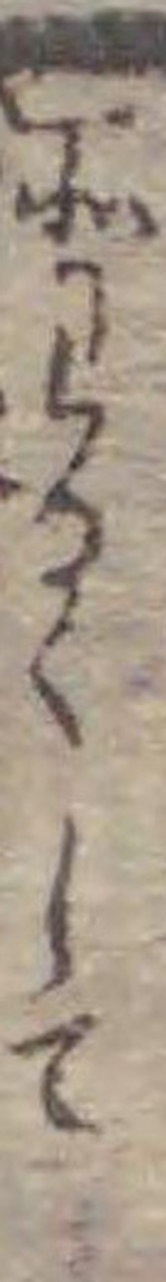所わるくして
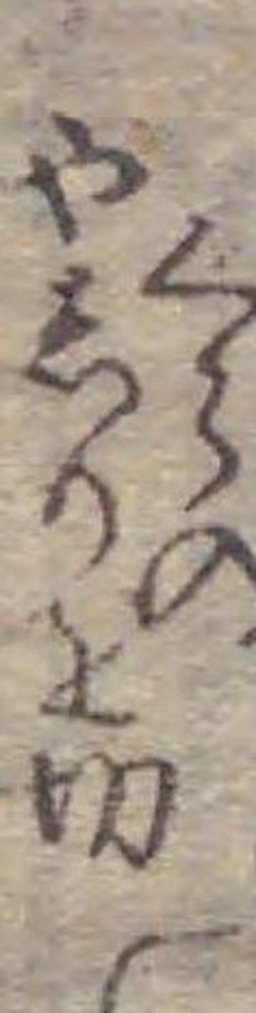やしりを切
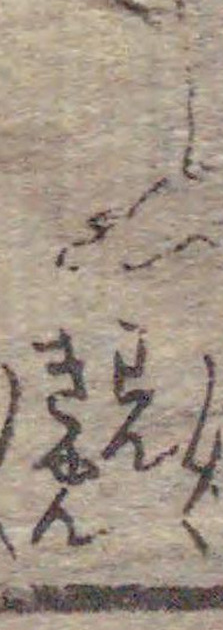きやん
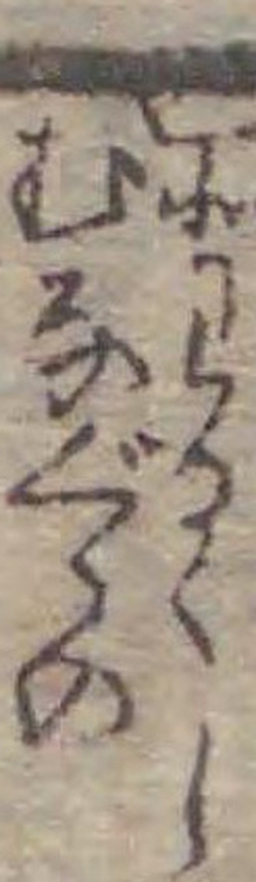むなぐらの
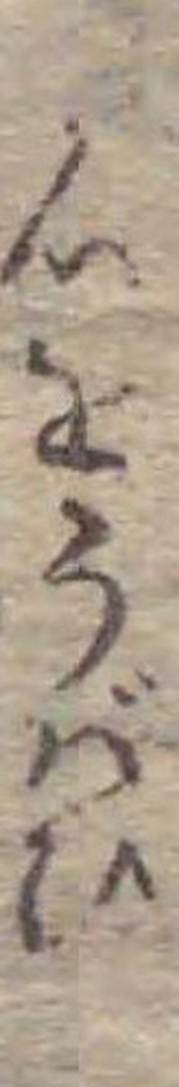心をうばひ
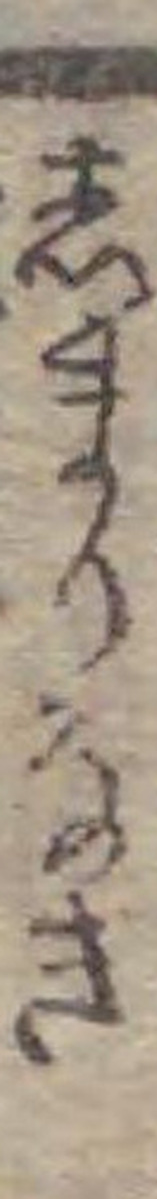しまりなき
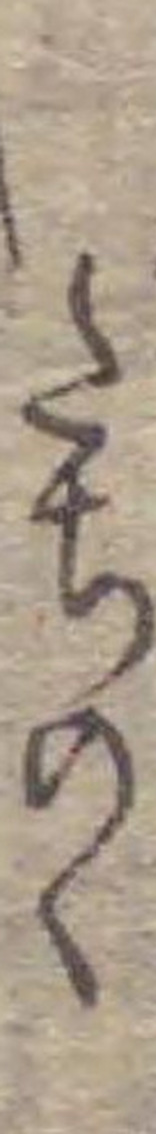たちのく
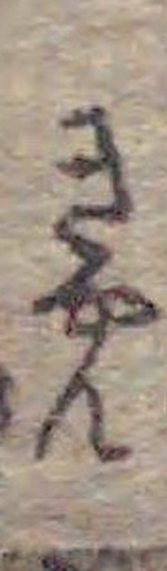きやん
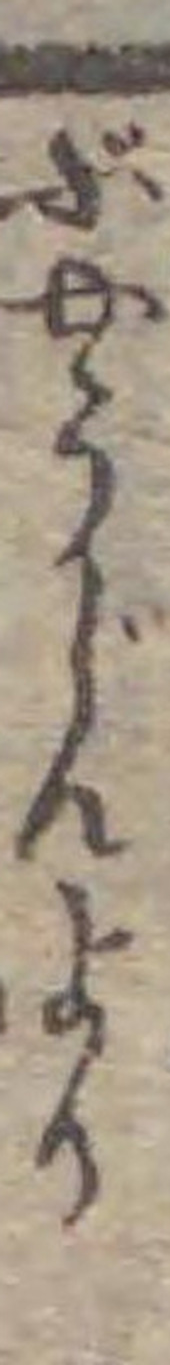ぶやうじんより
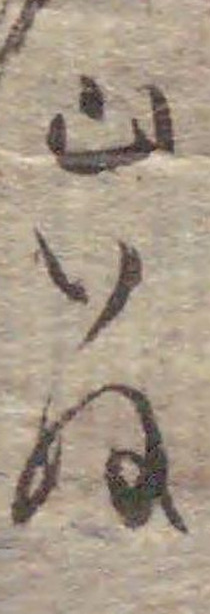山いぬ
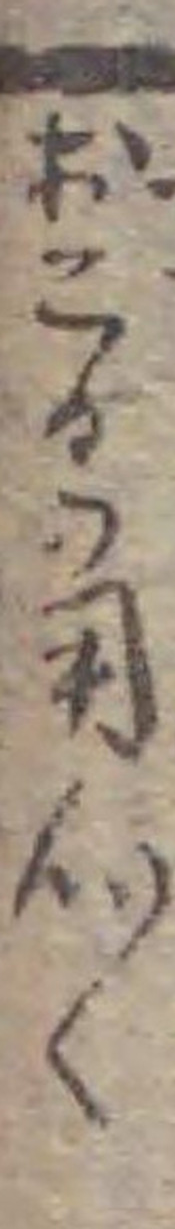おこる御用心〳〵

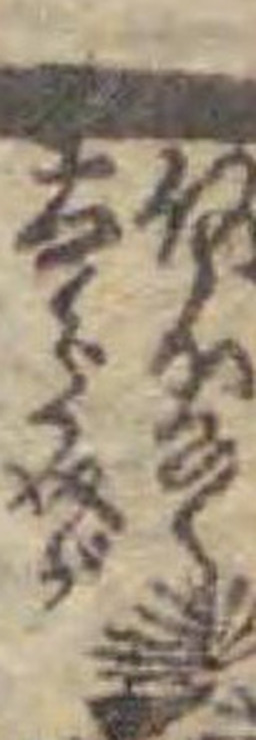太郎助が
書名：四遍搨心学草帋 : 3巻
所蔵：国立国会図書館 National Diet Library, JAPAN
